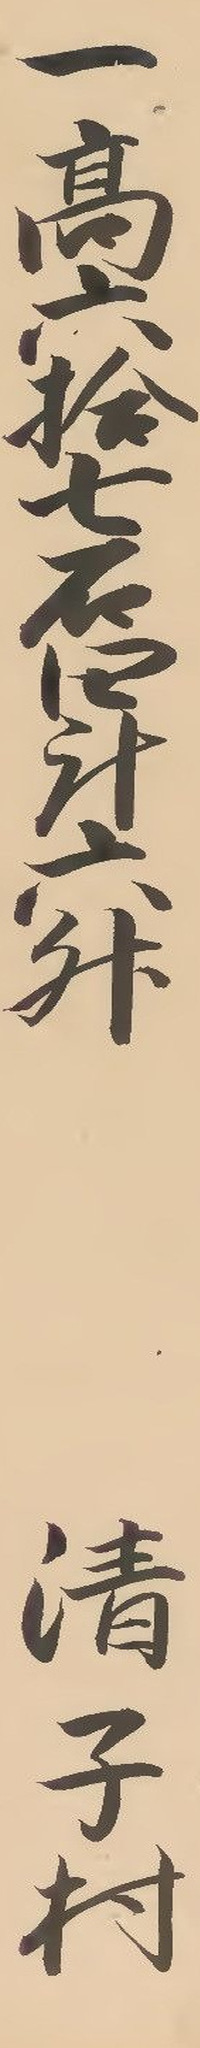一高六拾七石四斗六升清子村

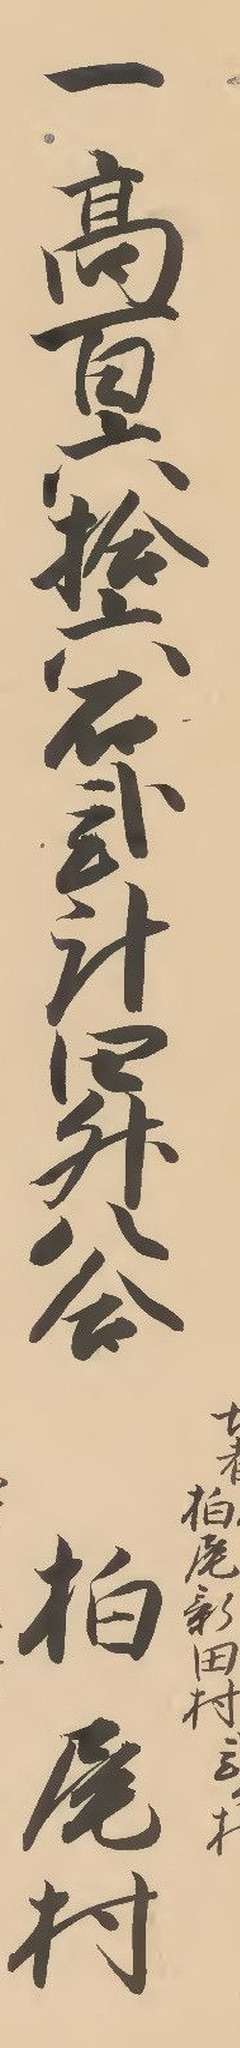一高百六拾六石弐斗四升八合柏尾村
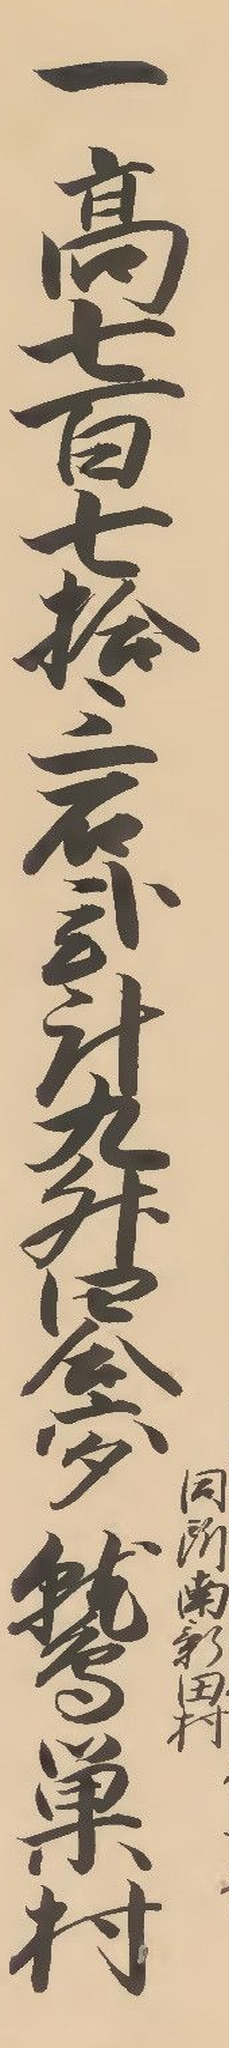一高七百七拾三石弐斗九升四合六匁鷲巣村
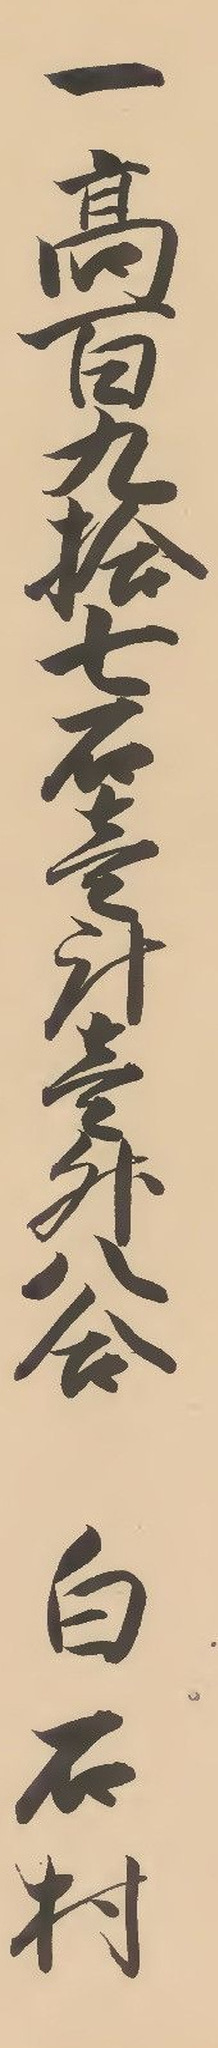一高百九拾七石壱斗壱升八合白石村
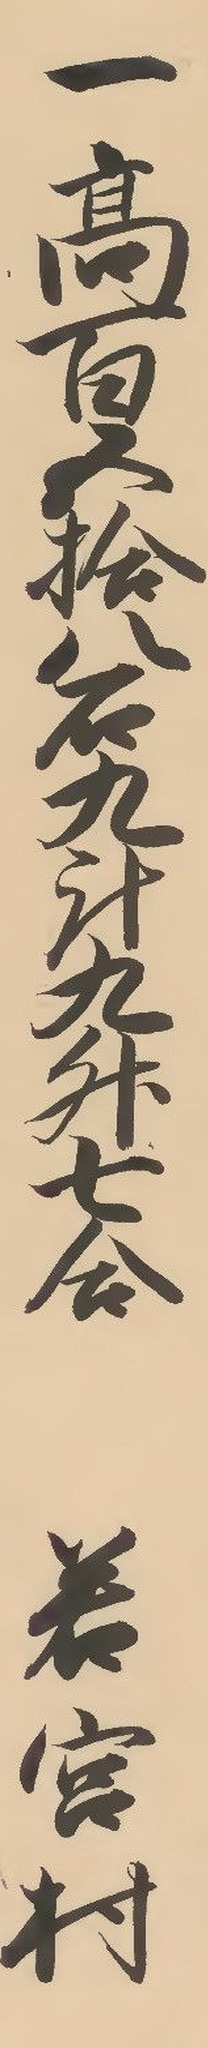一高百五拾八石九斗九升七合若宮村
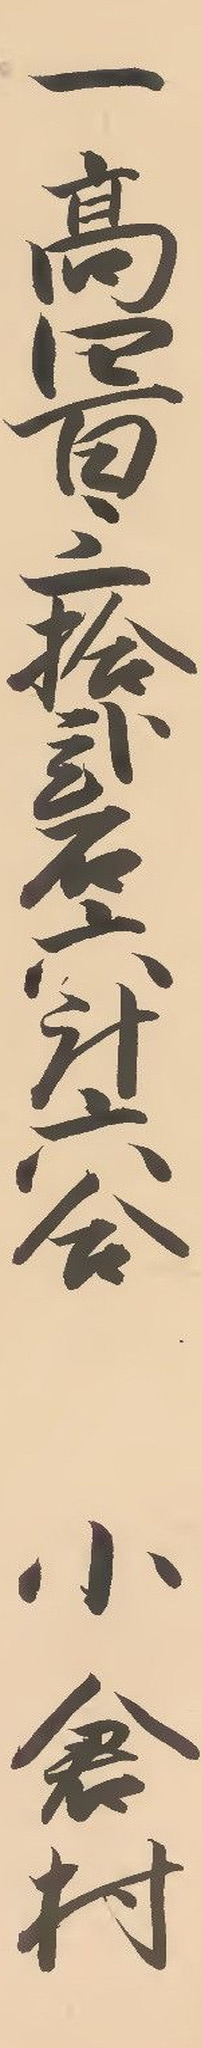一高四百三拾弐石六斗六合小倉村
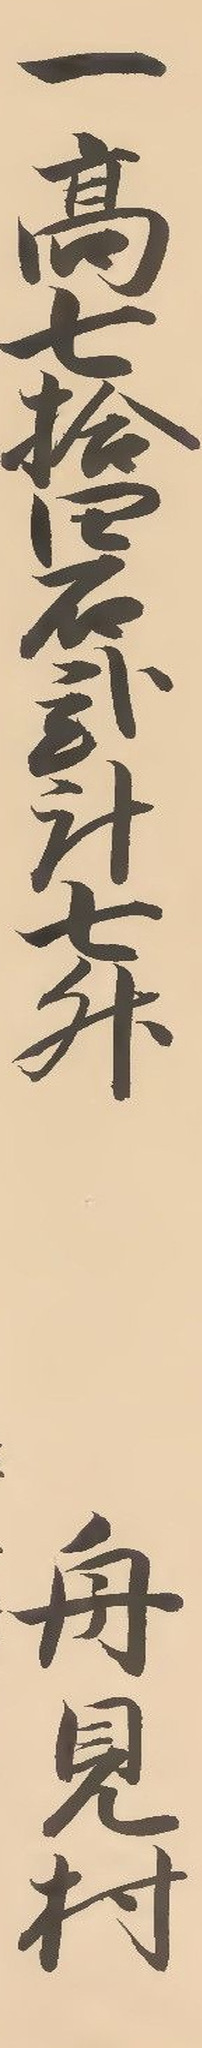一高七拾四石弐斗七升舟見村
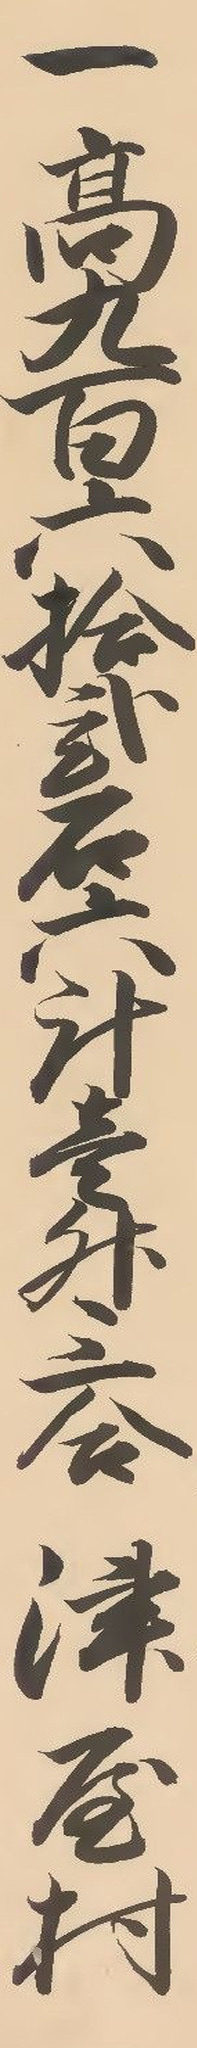一高九百六拾弐石六斗壱升三合津屋村
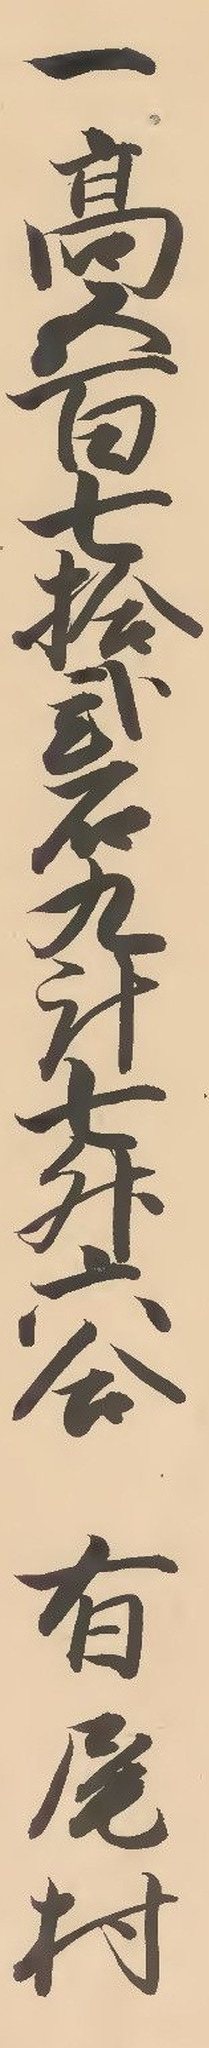一高五百七拾弐石九斗七升六合有尾村

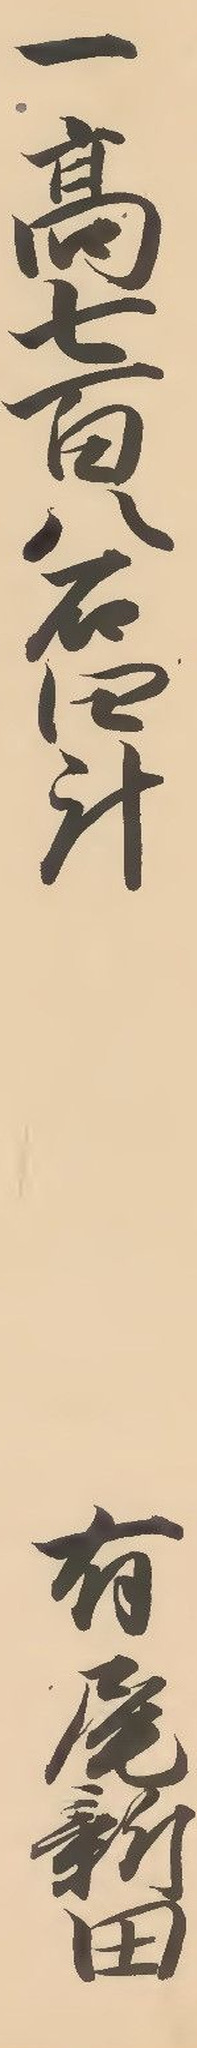一高七百八石四斗有尾新田
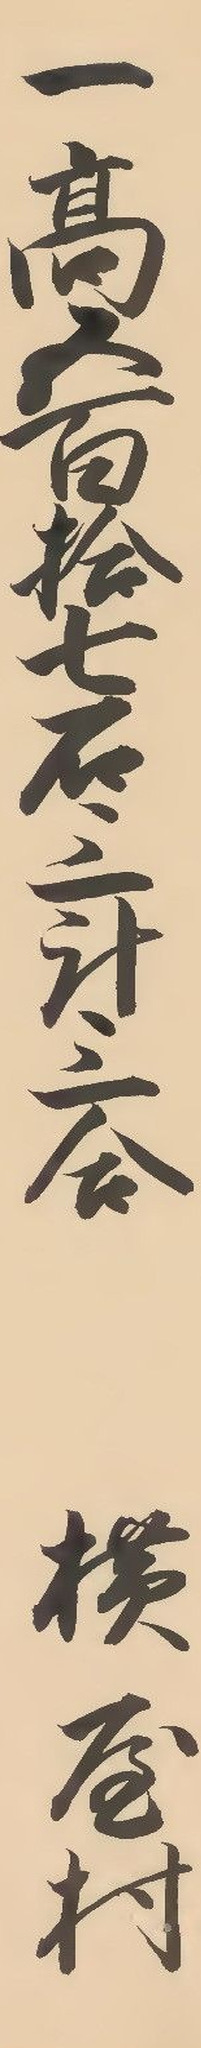一高五百拾七石三斗三合横屋村
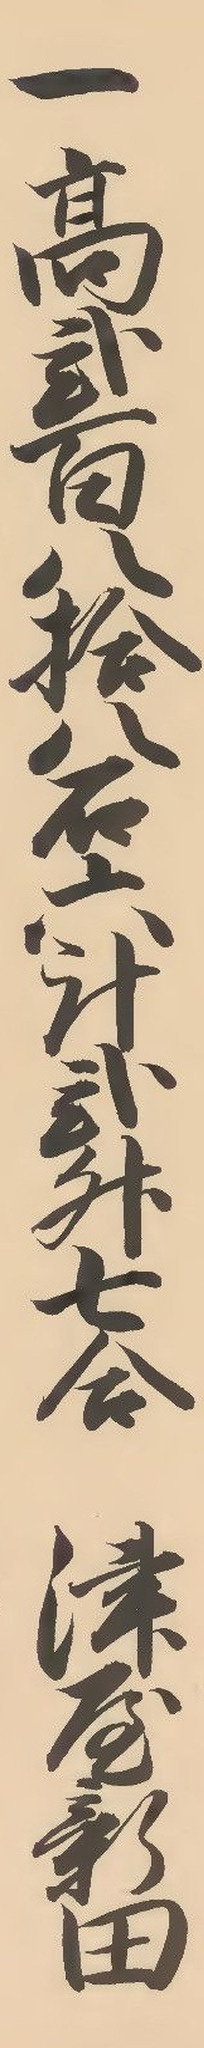一高弐百八拾八石六斗弐升七合津屋新田
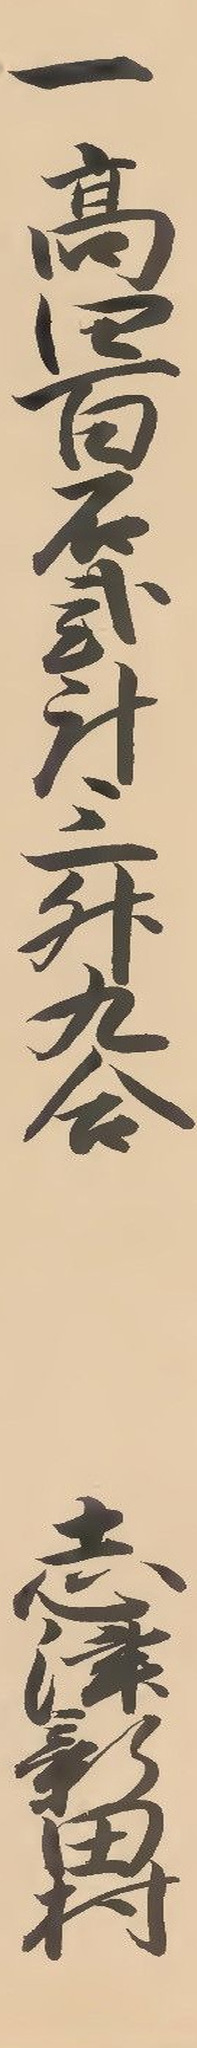一高四百石弐斗三升九合志津新田村
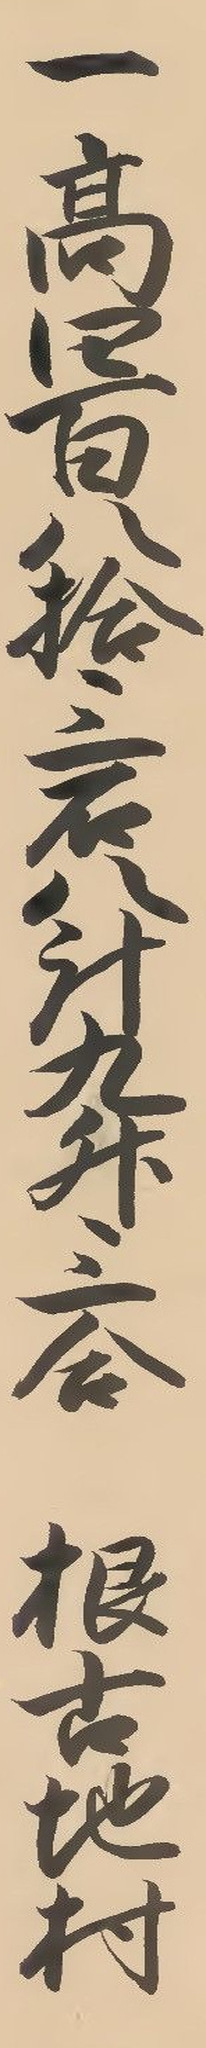一高四百八拾三石八斗九升三合根古地村
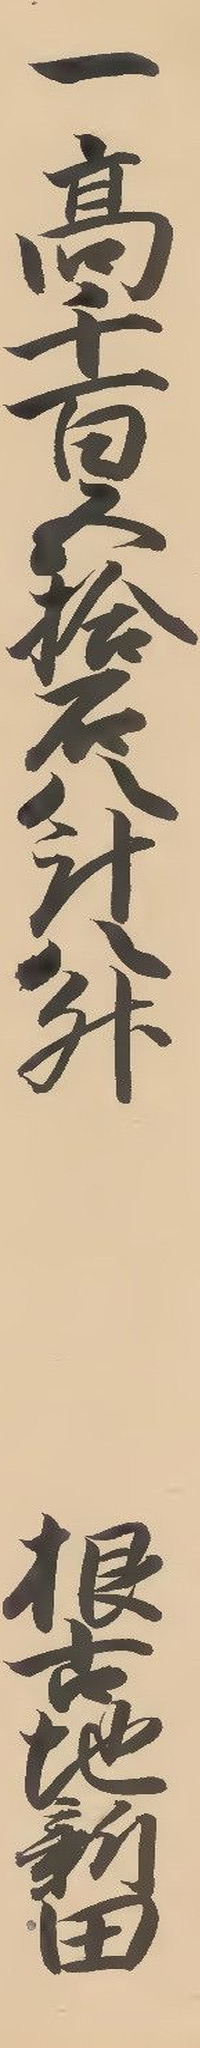一高千百五拾石八斗八升根古地新田
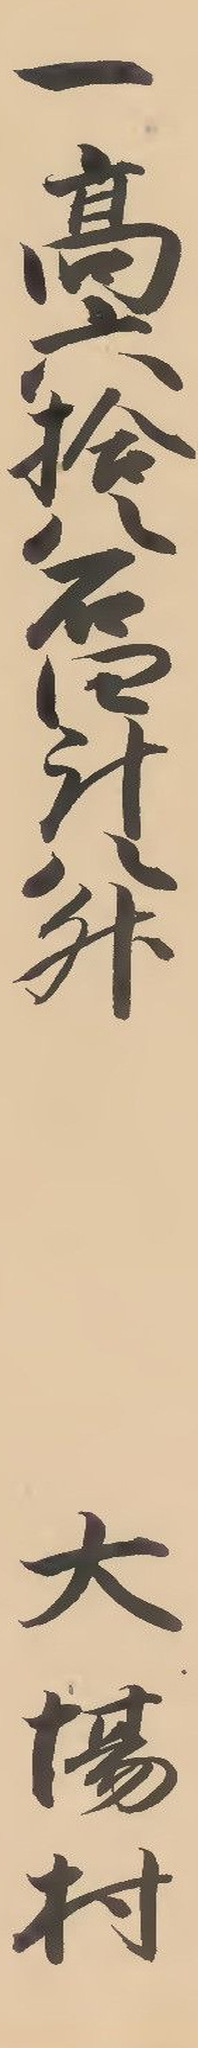一高六拾八石四斗八升大場村
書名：美濃国郷帳
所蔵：国立公文書館 National Archives of Japan
